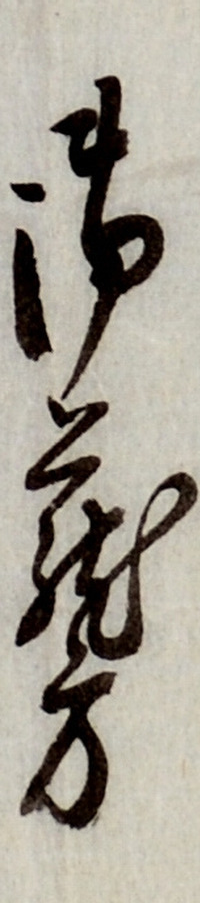御蔵方
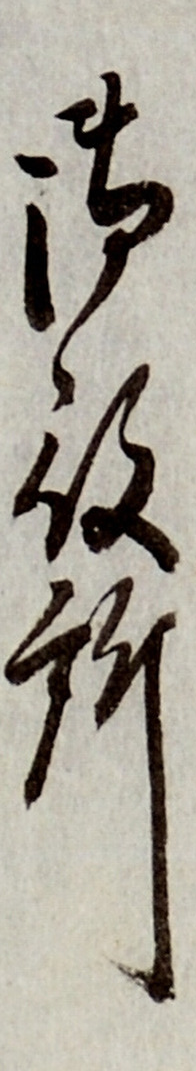御役所

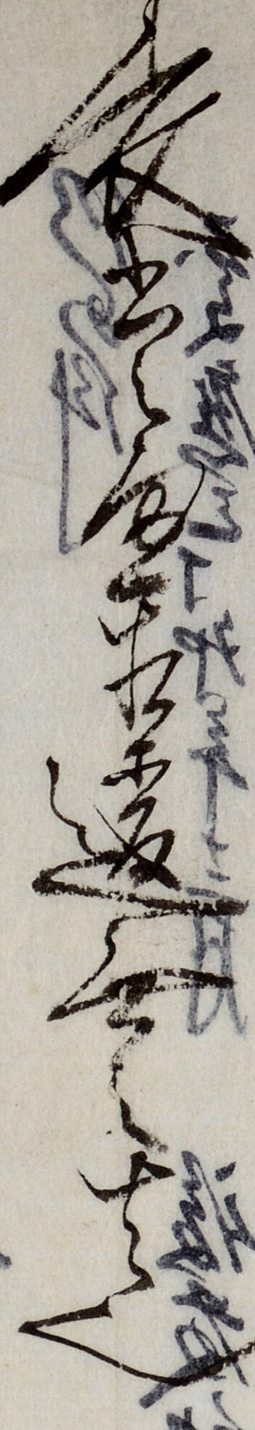表書之通相違無之者也
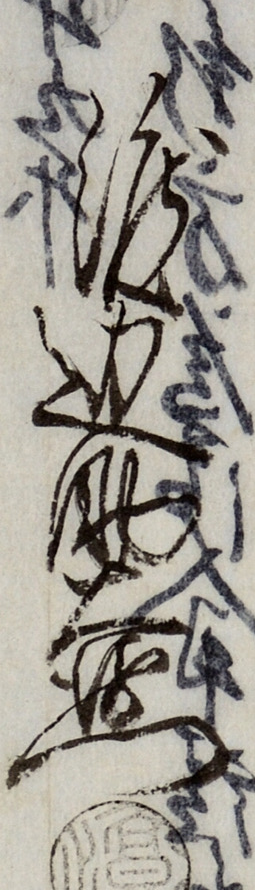渡辺助右衛門㊞

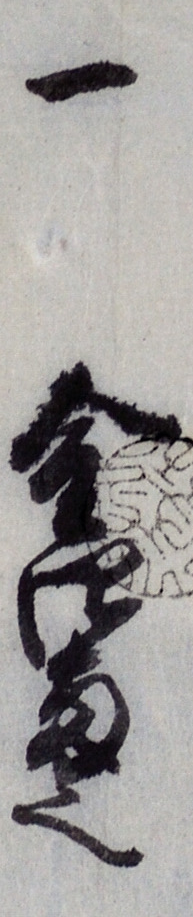一金四両也
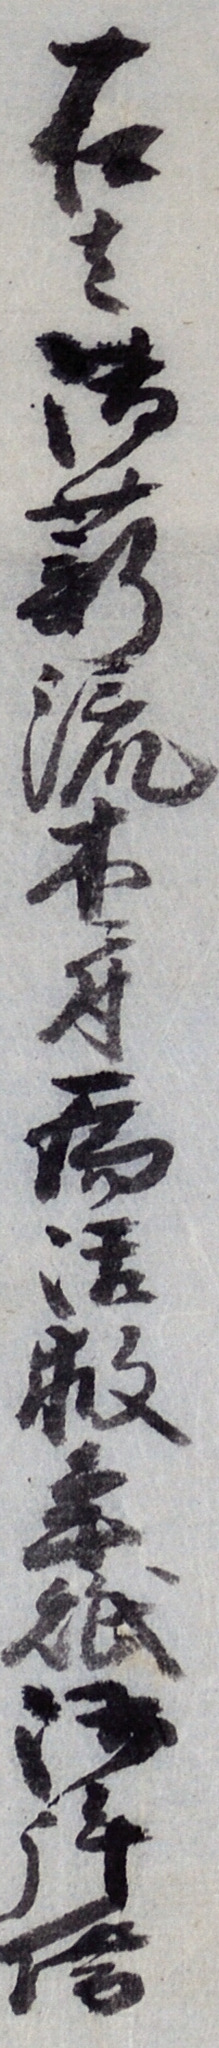右者御薪流木ニ付為御救年賦御拝借
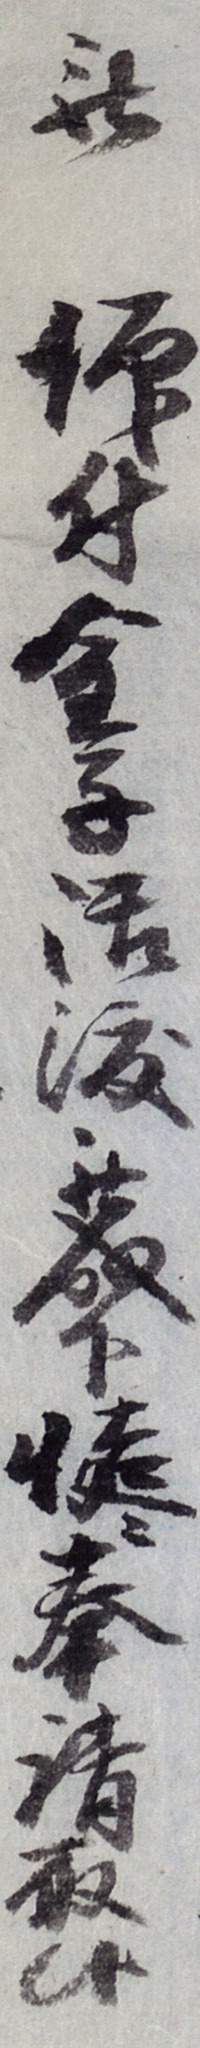被仰付金子御渡被成下慥ニ奉請取候
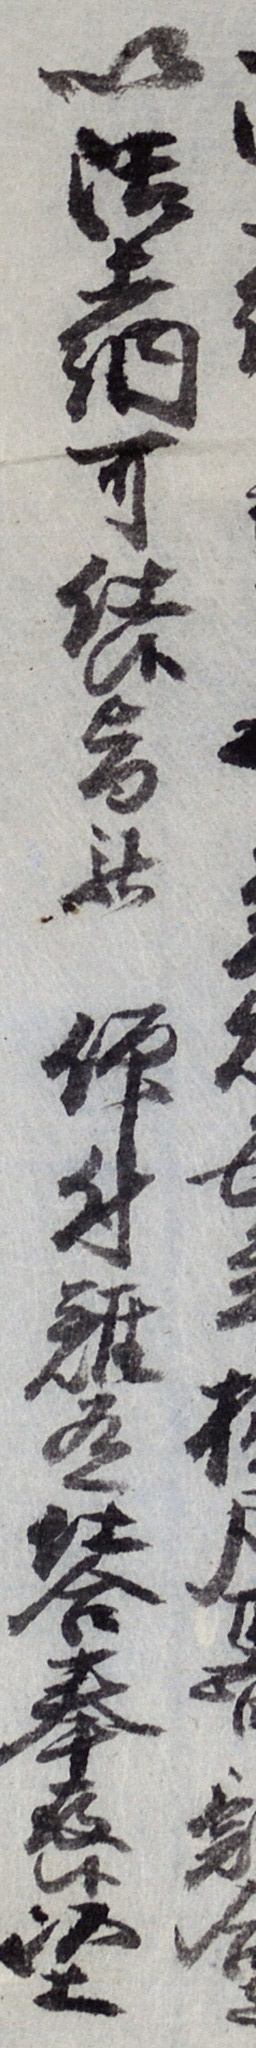以御上納可仕候旨被仰付難有仕合奉存候以上
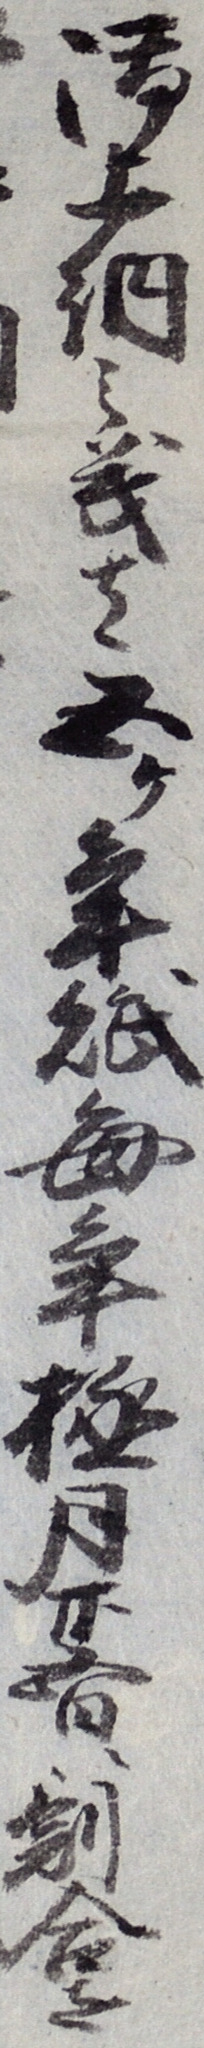御上納之義者五ヶ年賦毎年極月廿五日ニ割合を
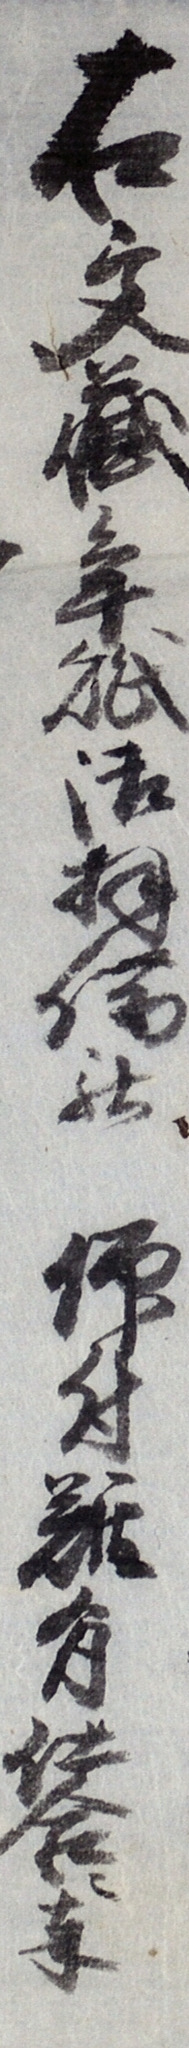右文蔵年賦御拝借被仰付難有仕合ニ奉
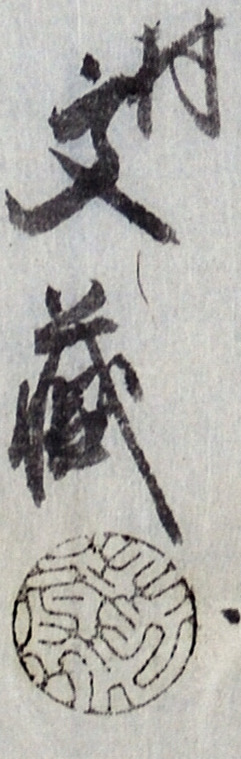文蔵㊞
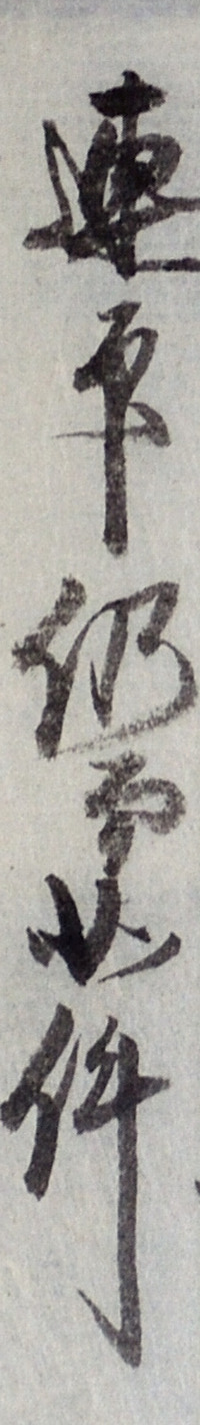連印仍而如件
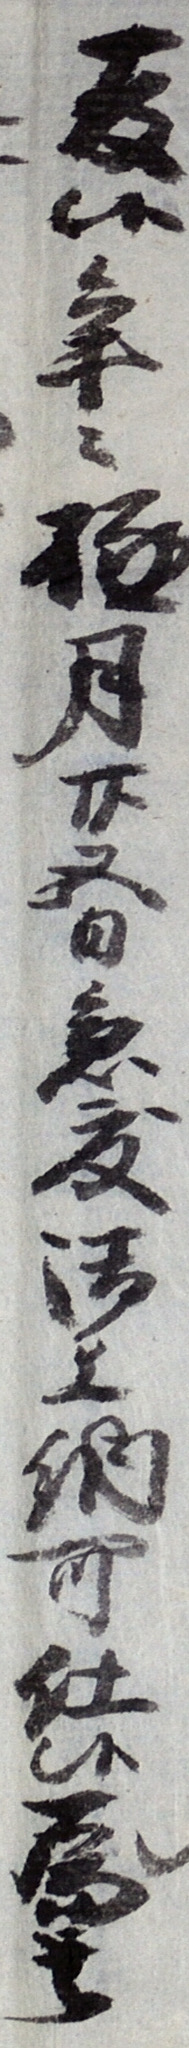存候年々極月廿五日急度御上納可仕候為其
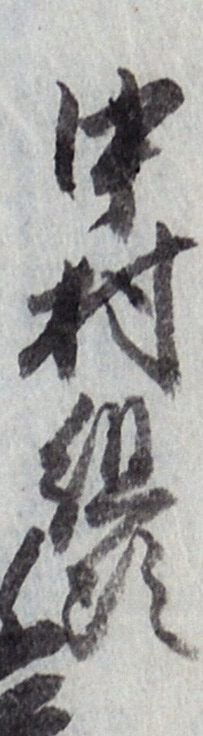中村組頭
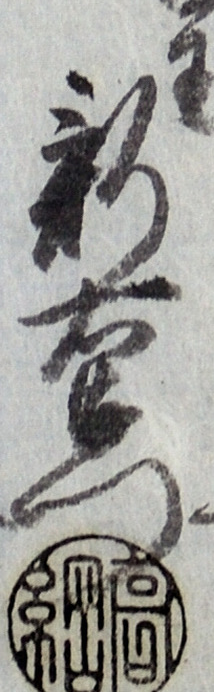新右衛門㊞
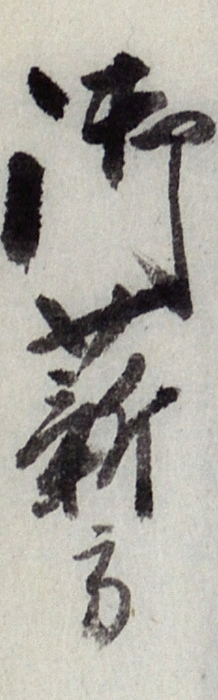御薪方
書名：覚
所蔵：伊那市立高遠町図書館・合同会社AMANE
